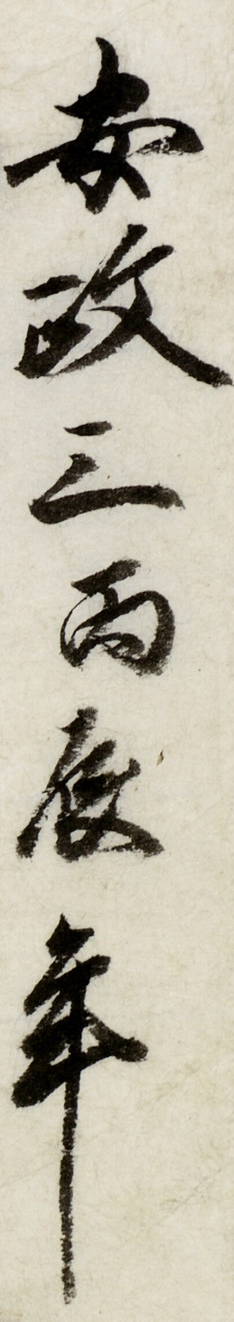安政三丙辰年
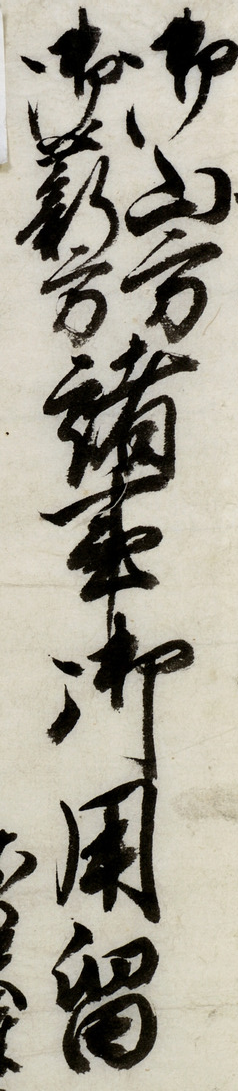御薪方諸事御用留
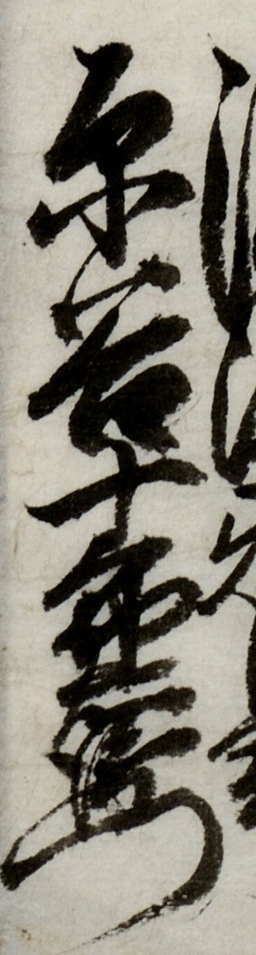原谷十郎右衞門
